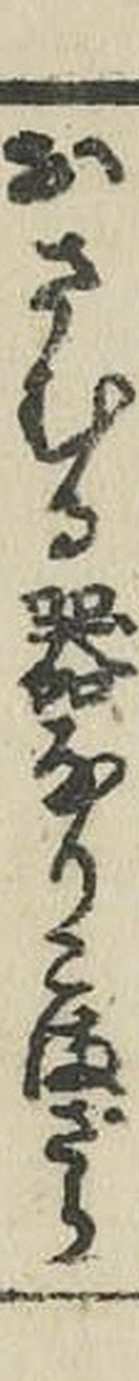おさむる器なりこまざら
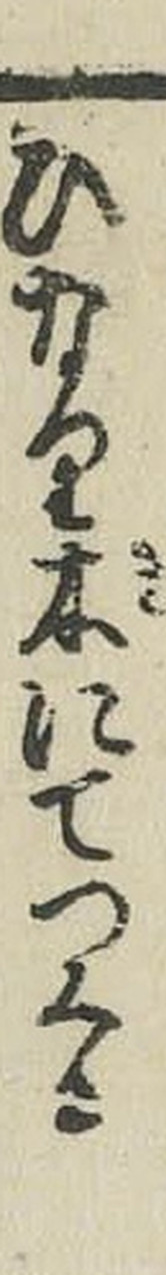ひなり木にてつくる

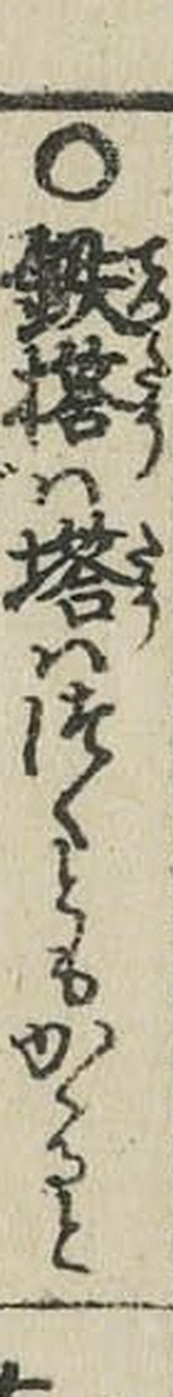○鉄搭は塔はつくともかゝると
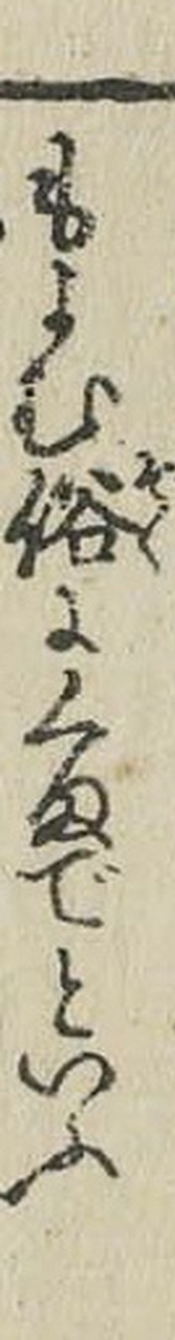もよむ俗にくまでといふ
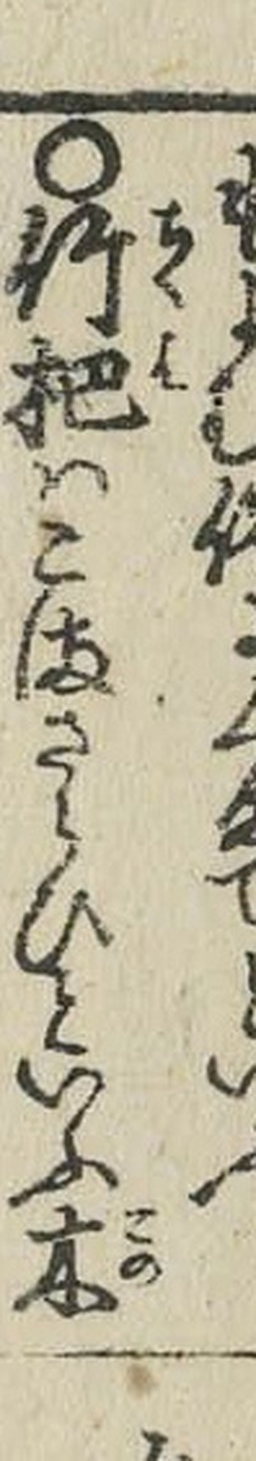○竹把はこまさらひといふ木
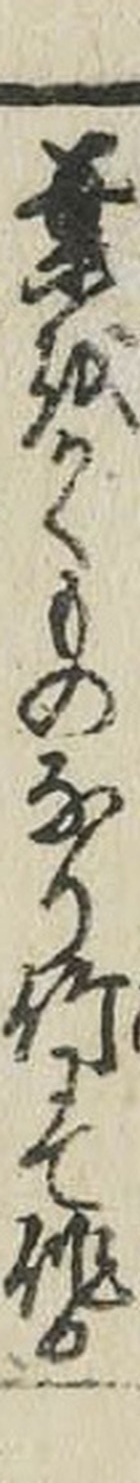葉をかくものなり竹にて作る
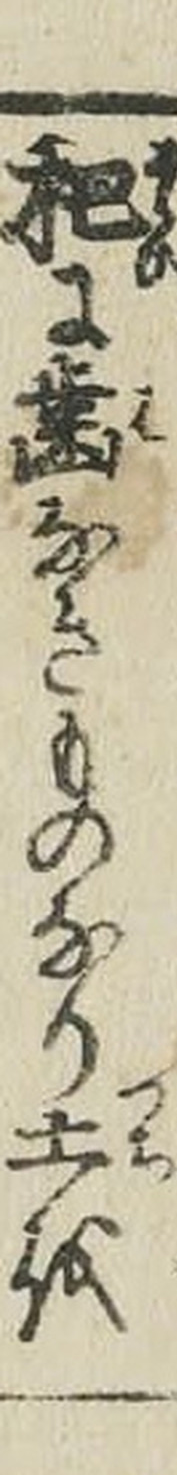杷に歯なきものなり土を
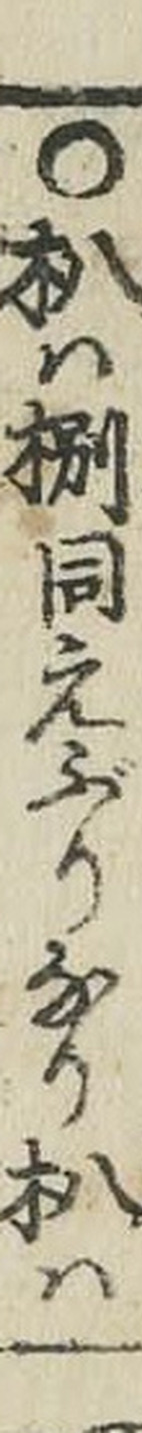○朳は㭭同えぶりなり朳は
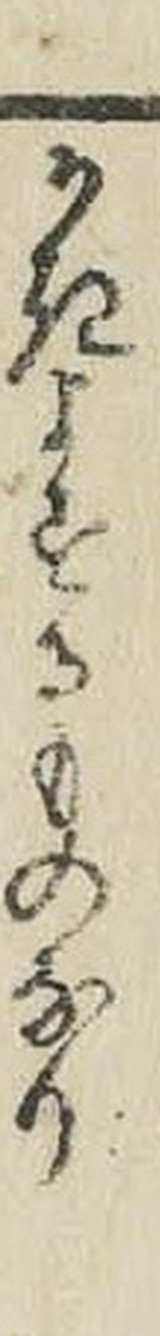かきよするものなり
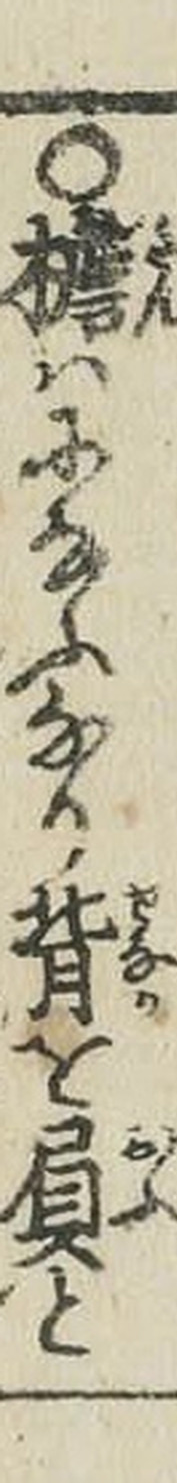○檐はになふなり背を負と
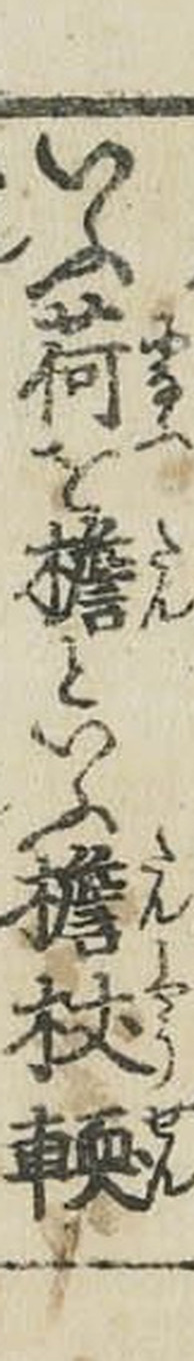いふ荷を檐といふ檐杖輭
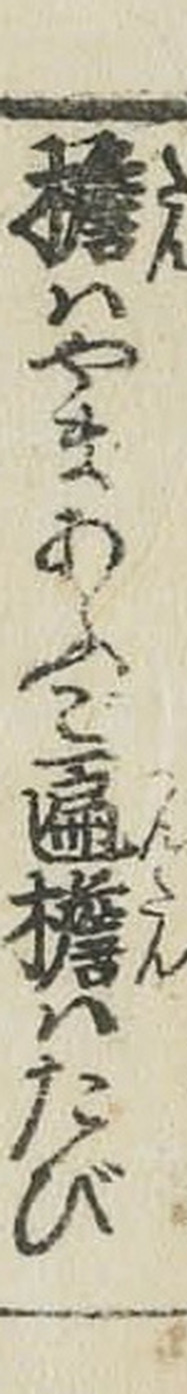檐はやまあふご匾檐はたび
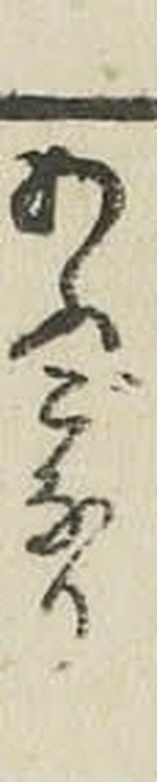あふごなり
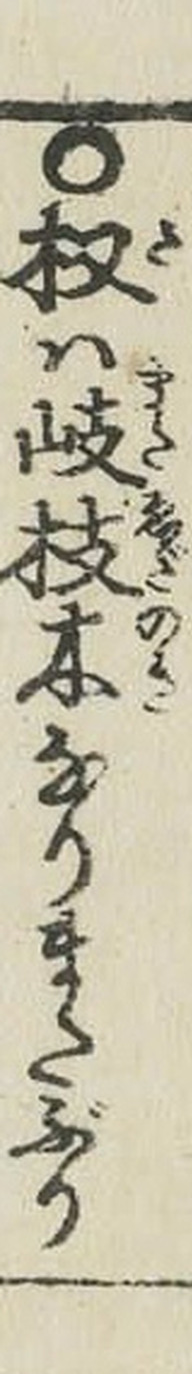○杈は岐枝木なりまたぶり
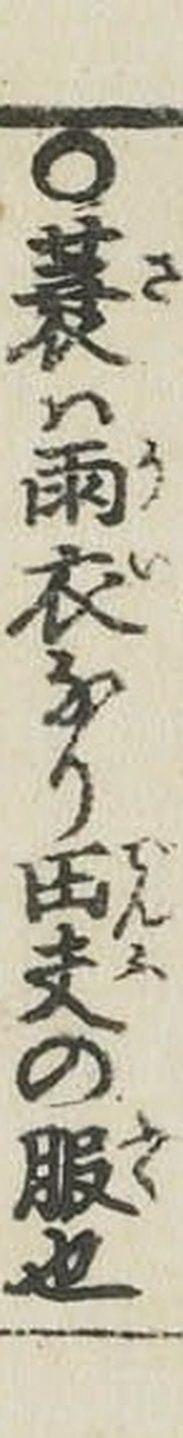○蓑は雨衣なり田夫の服也
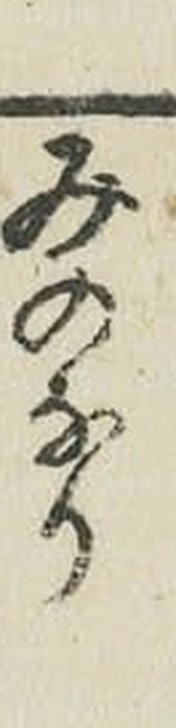みのなり
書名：増補頭書訓蒙図彙大成 10巻 5:巻之9-11
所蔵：東京学芸大学教育コンテンツアーカイブ
